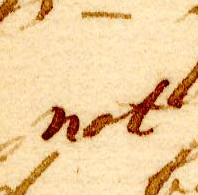not
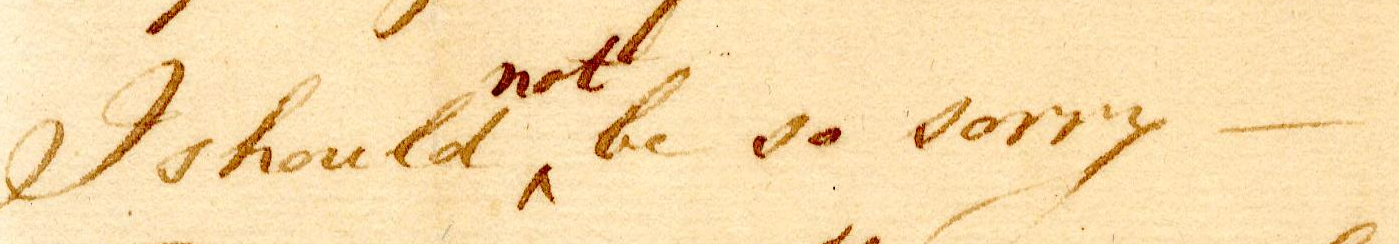I should ^ be so sorry-
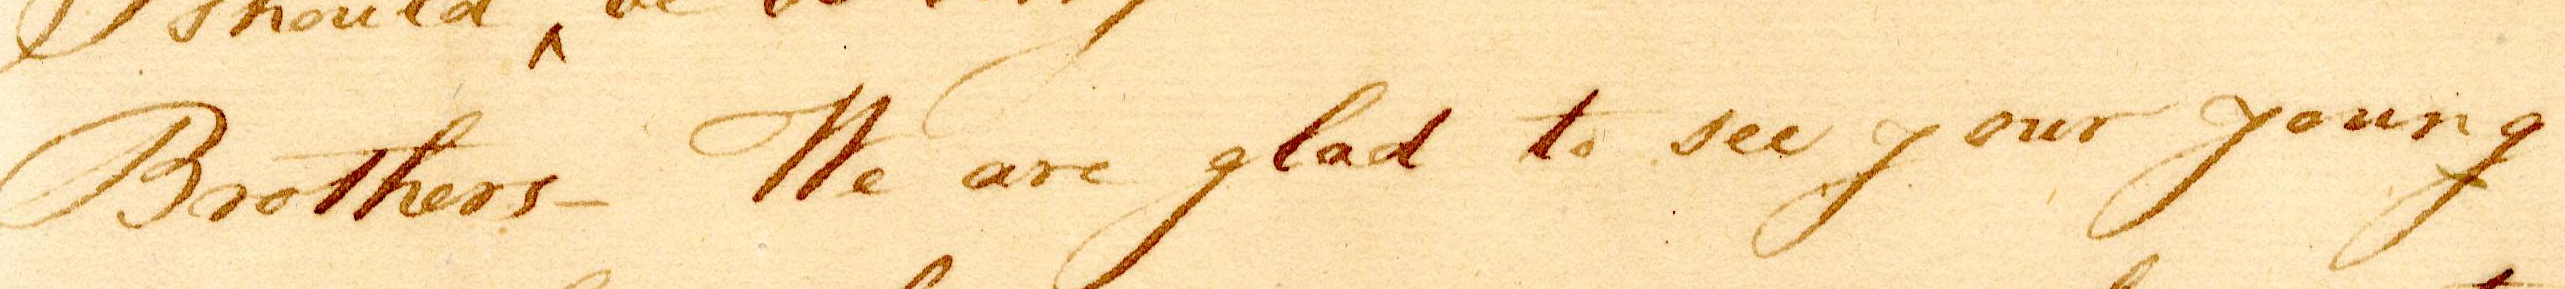Brothers- We are glad to see your young
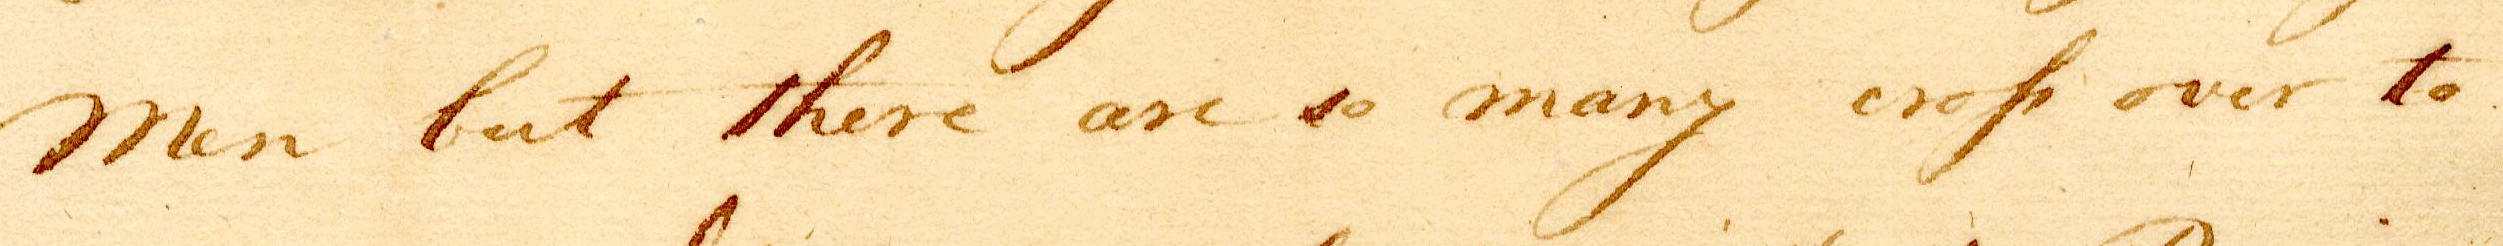Men but there are so many cross over to
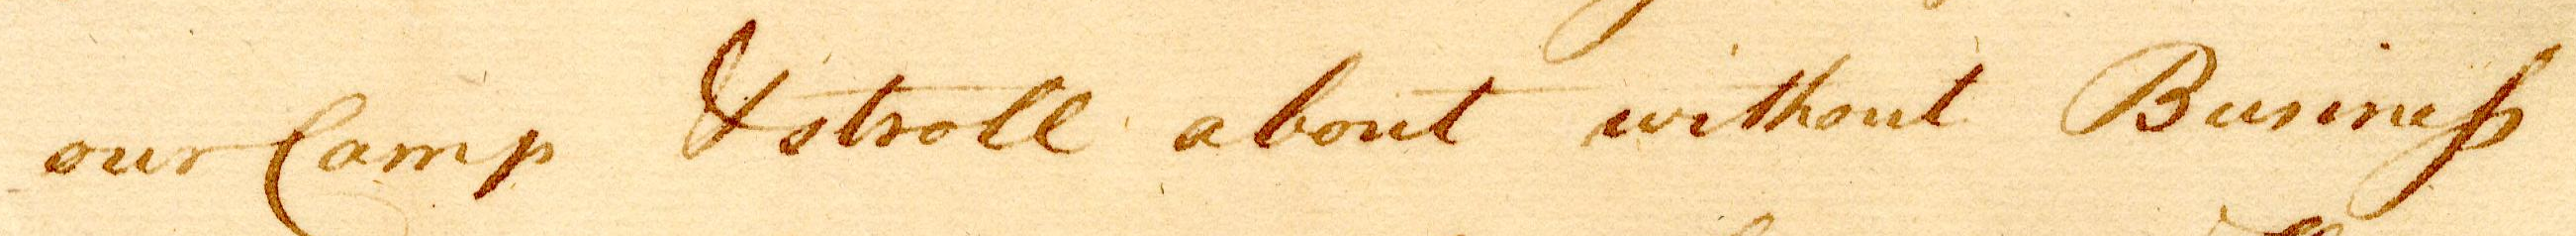our Camp & stroll about without Business
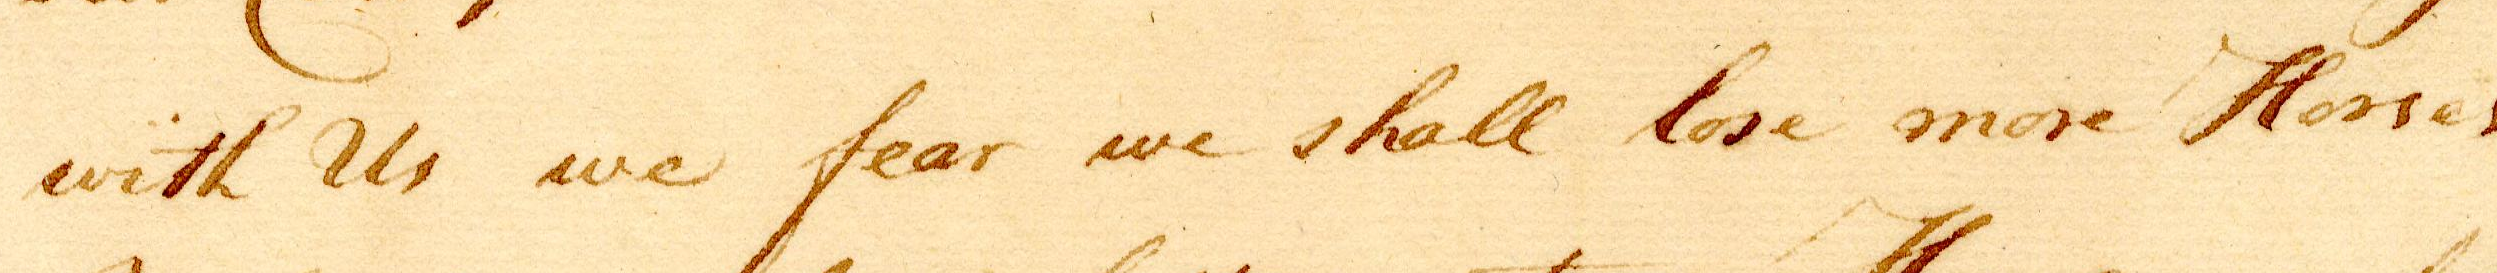with Us we fear we shall lose more Horses
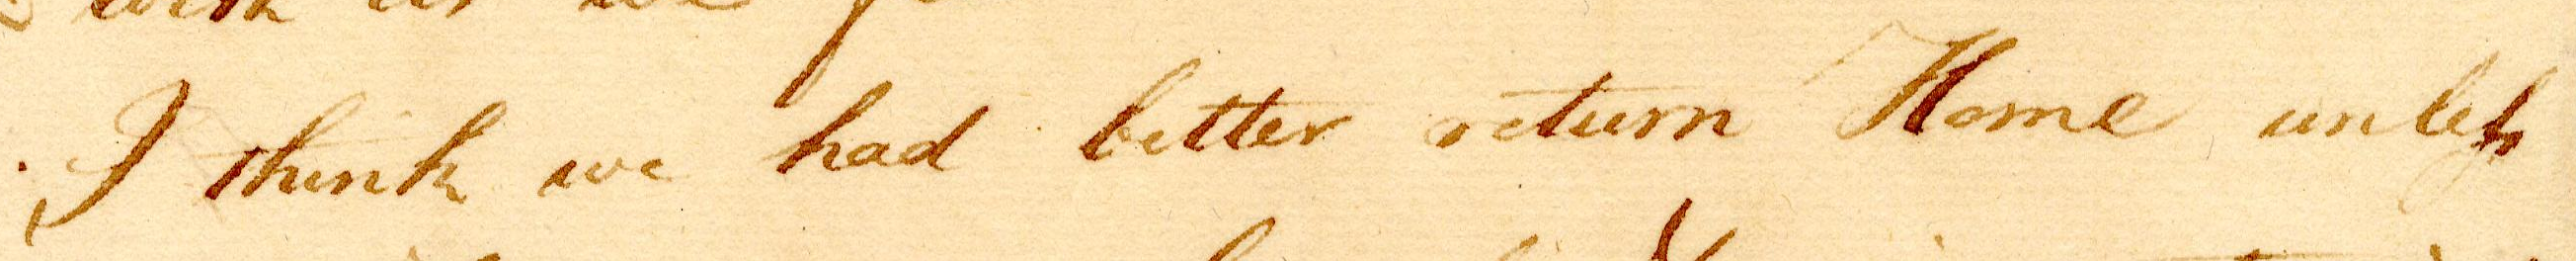I think we had better return Home until
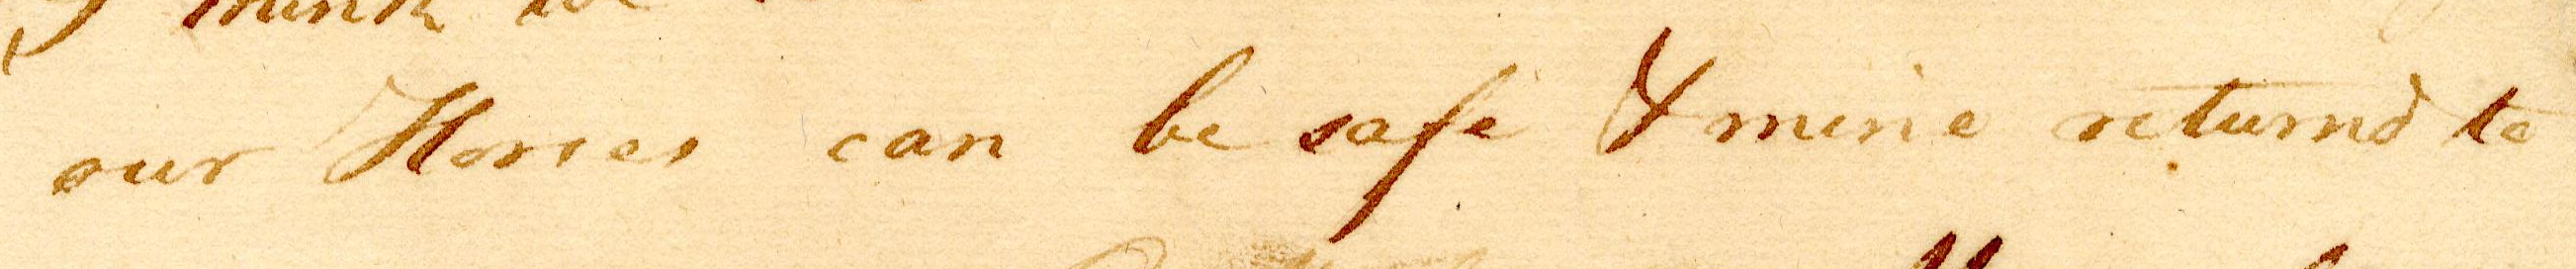our Horses can be safe & mine returnd to
